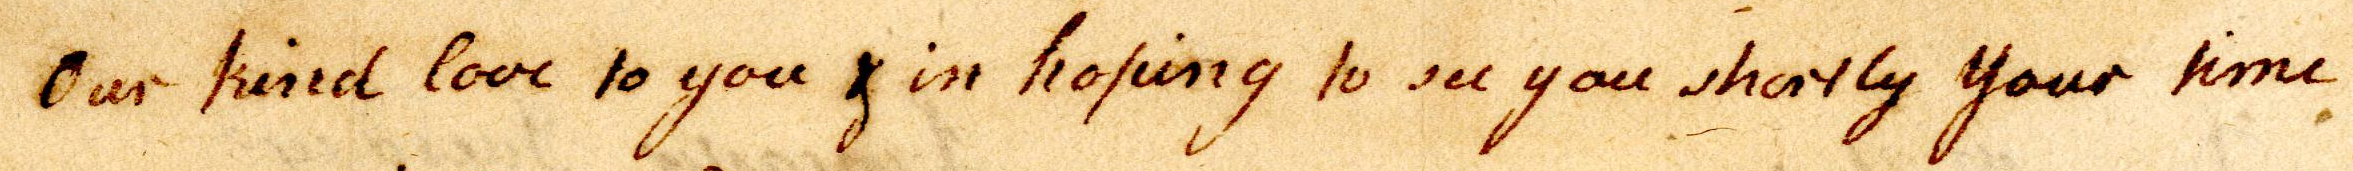Our kind love to you & in hoping to see you shortly Your time
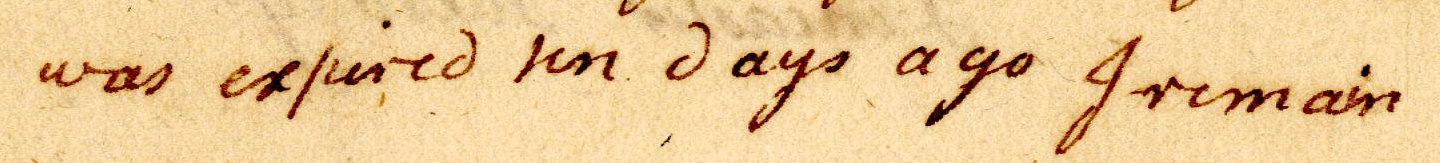was expired ten days ago I remain
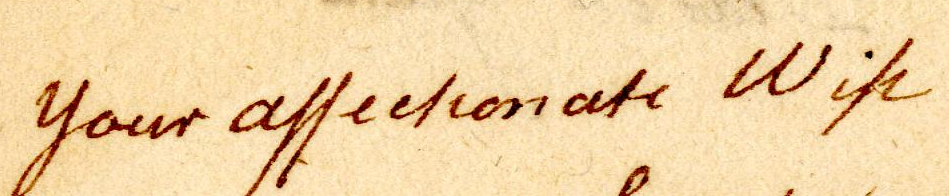Your affectionate Wife
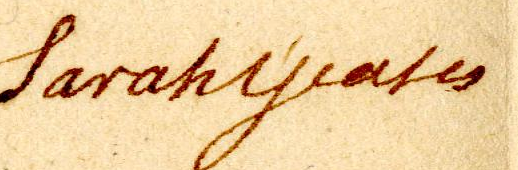Sarah Yeates
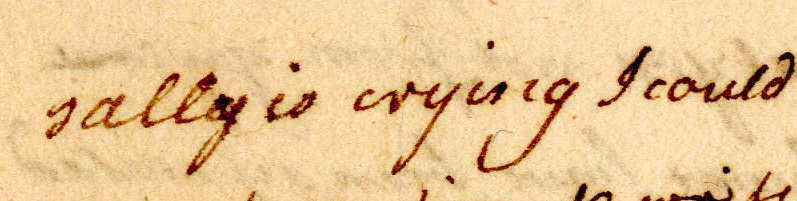Sally is crying I could
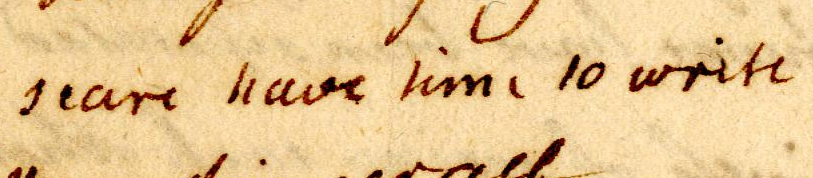scarce have time to write
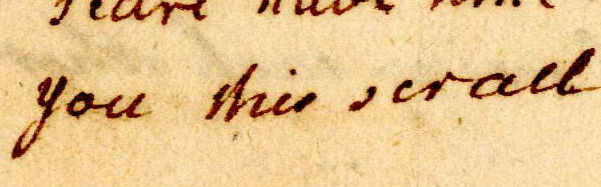You this scrall
